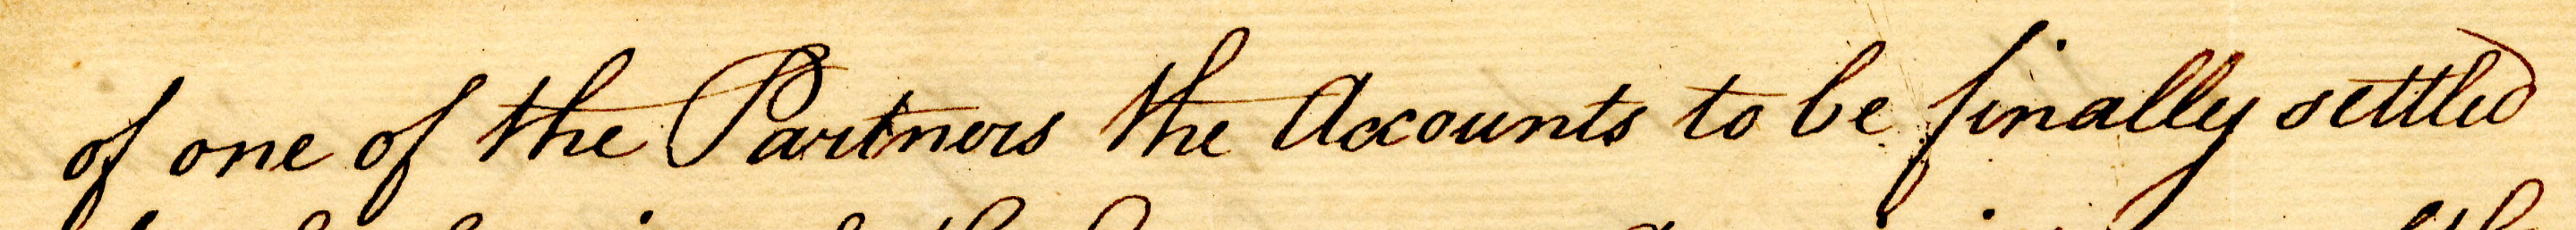of one of the Partners the Accounts to be finally settled
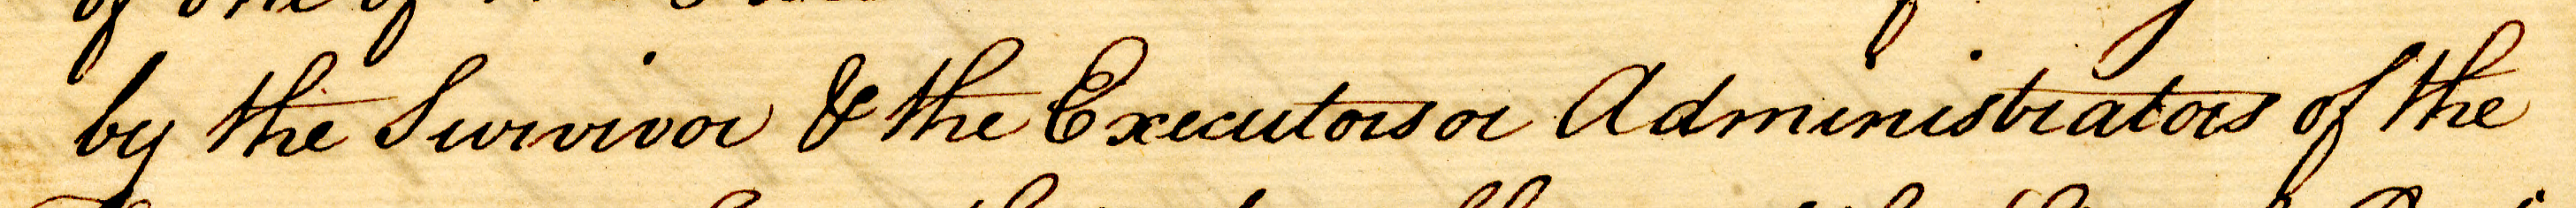by the Survivor & the Executors or Administrators of the
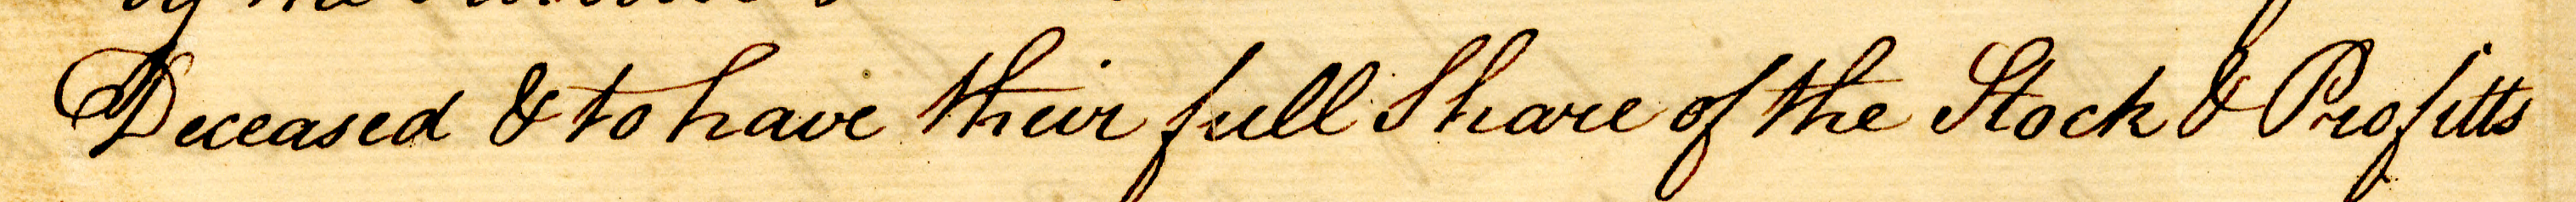Deceased & to have their full share of the Stock & Profitts
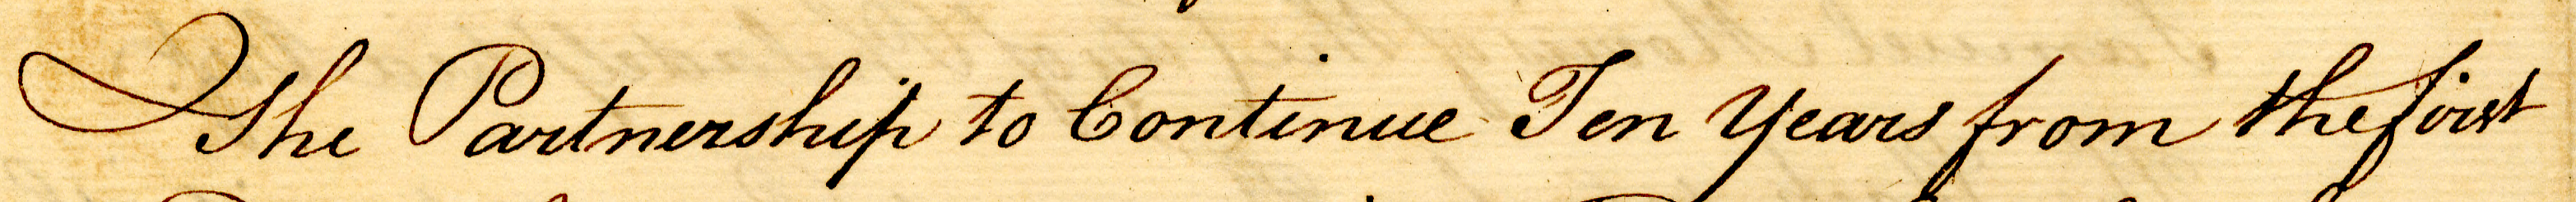The Partnership to Continue Ten years from the first
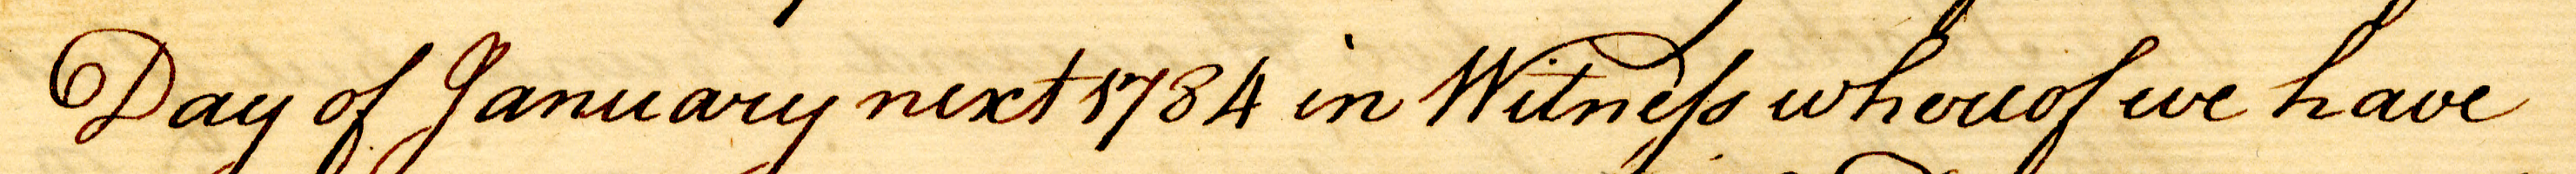Day of January next 1784 in Witness whereof we have
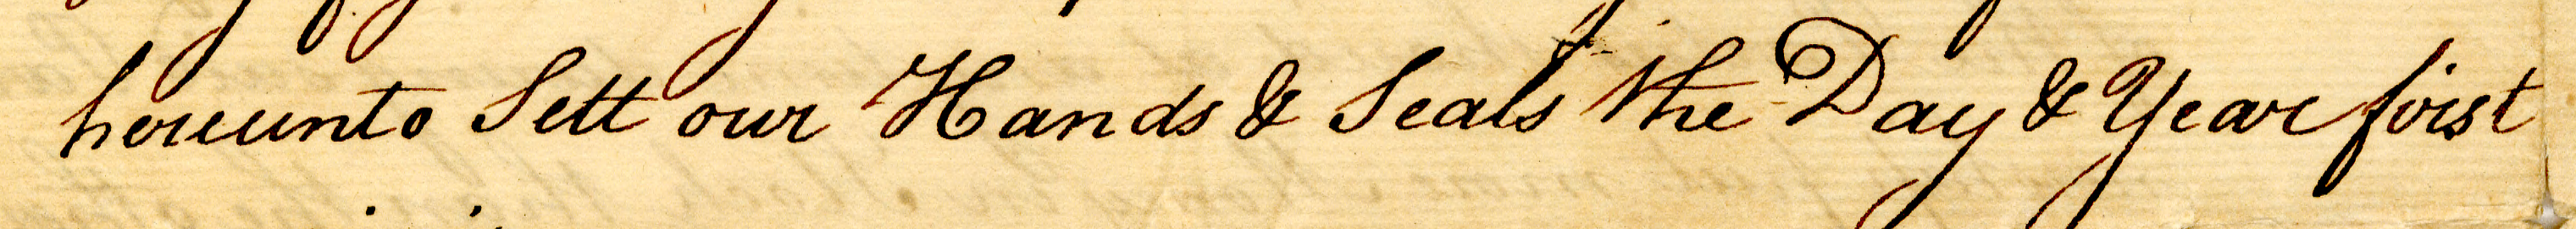hereunto Sett our Hands & Seals the Day & Year first
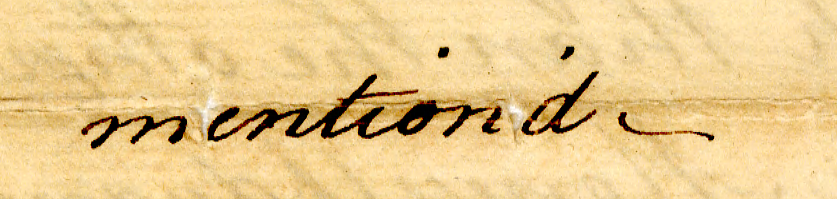mention'd-
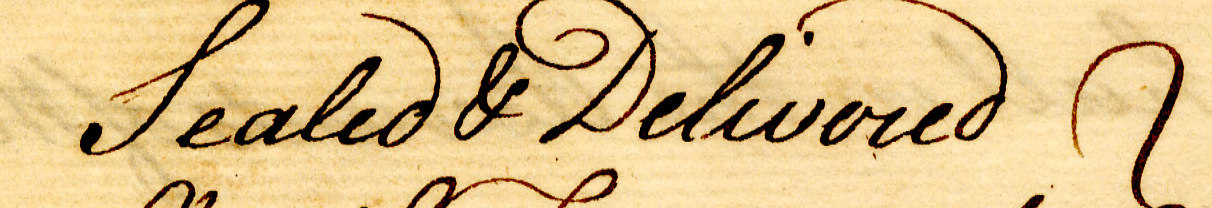Sealed & Delivered
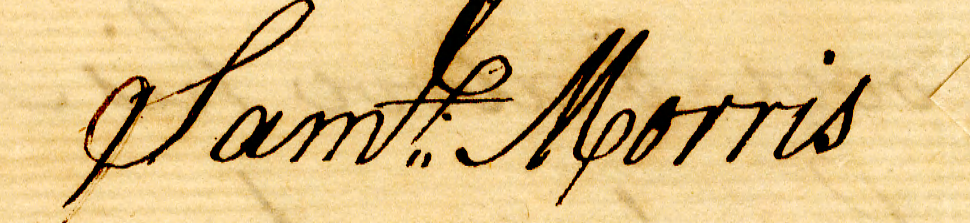Sam^l. Morris
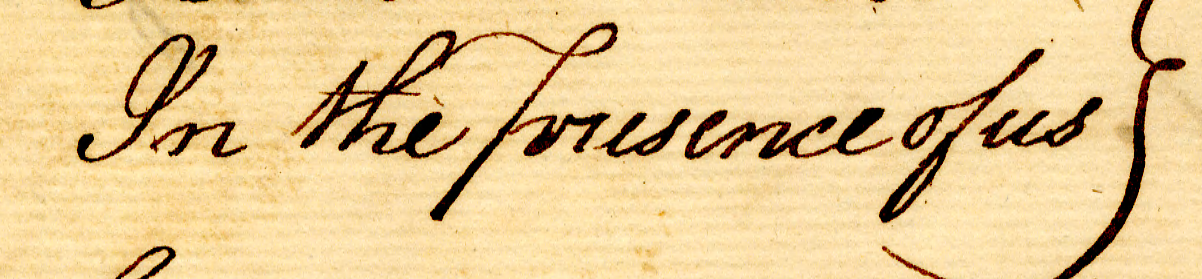In the presence of us
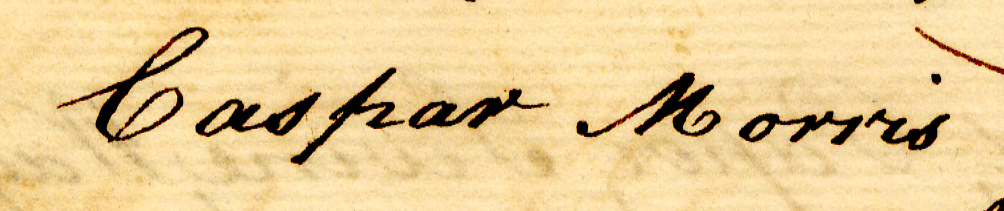Caspar Morris
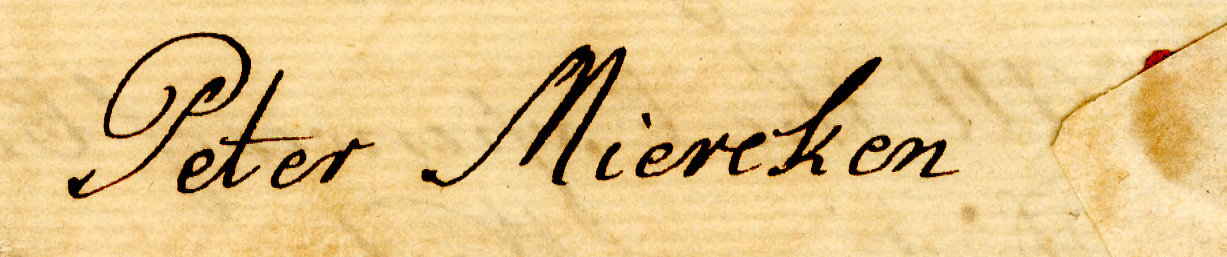Peter Miercken
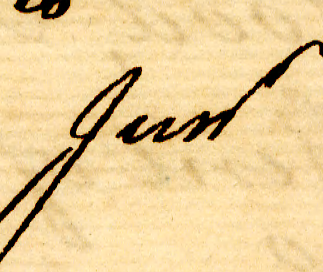Jun^r
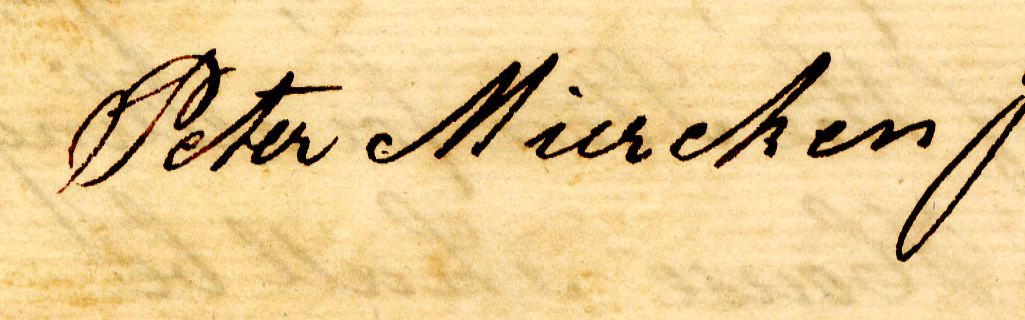Peter Miercken
